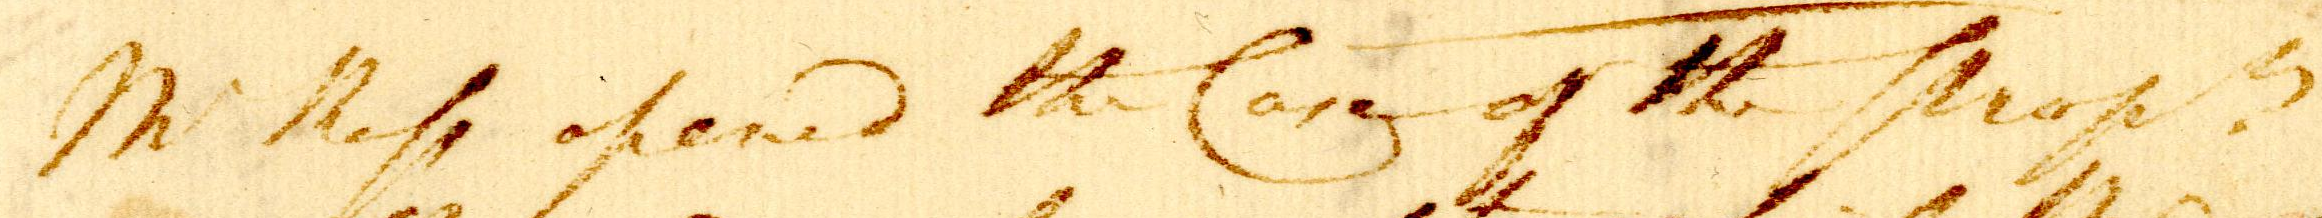M^r Ross opened the Case of the prop^y
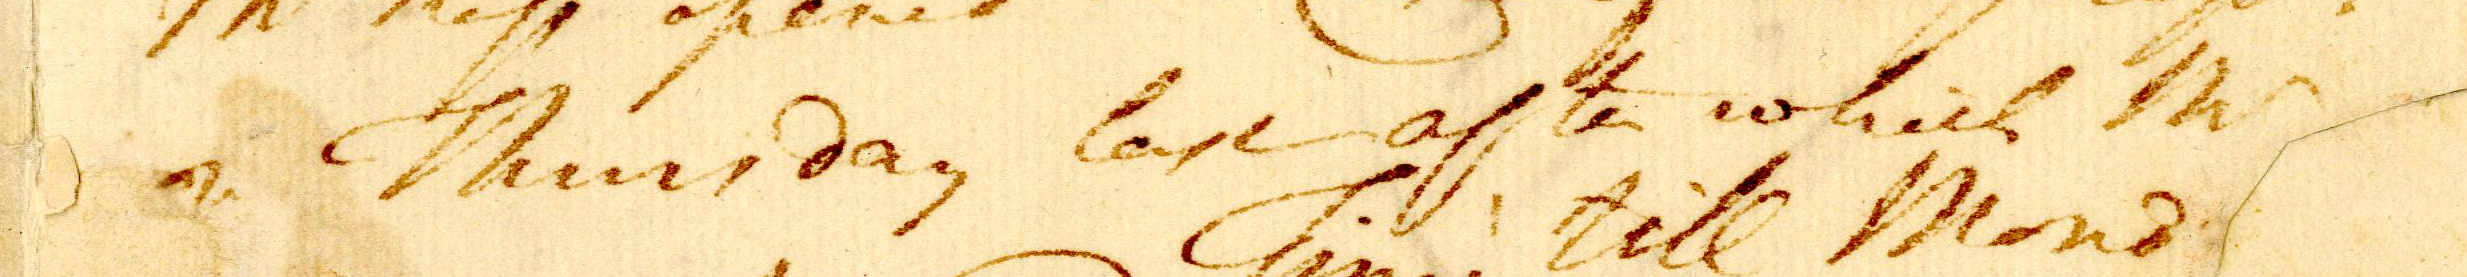on Thursday last after which the
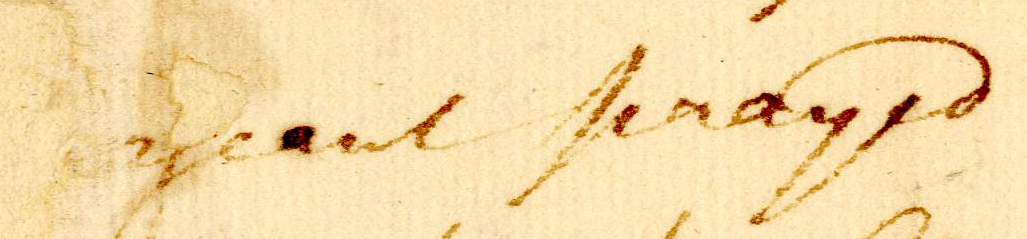[_]eant prayed
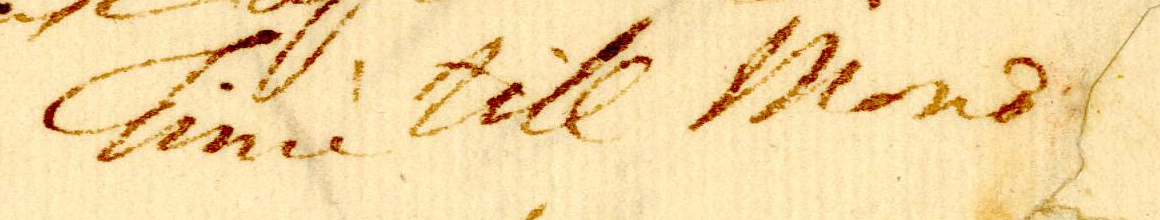Time will Mend
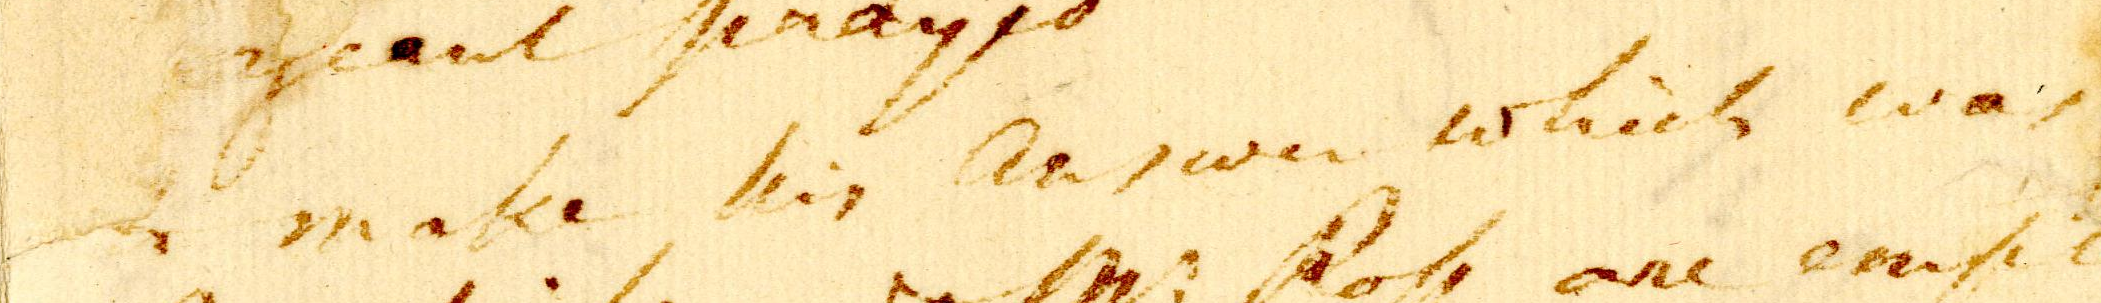or make his Answer which was
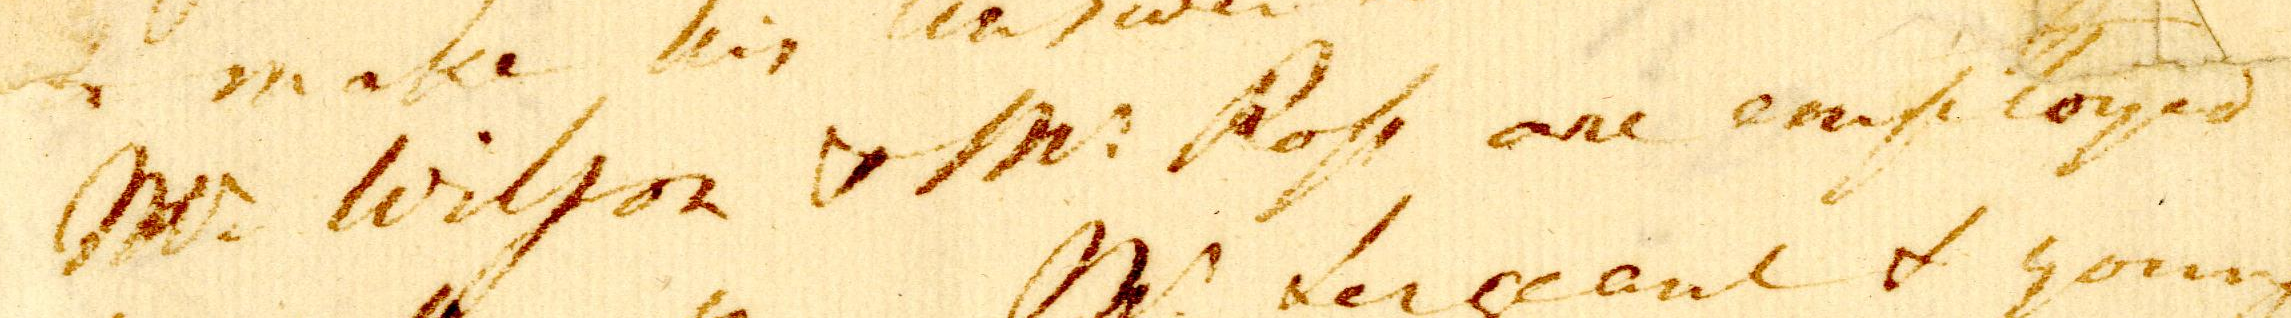M^r. Wilson & M^r. Ross are employed
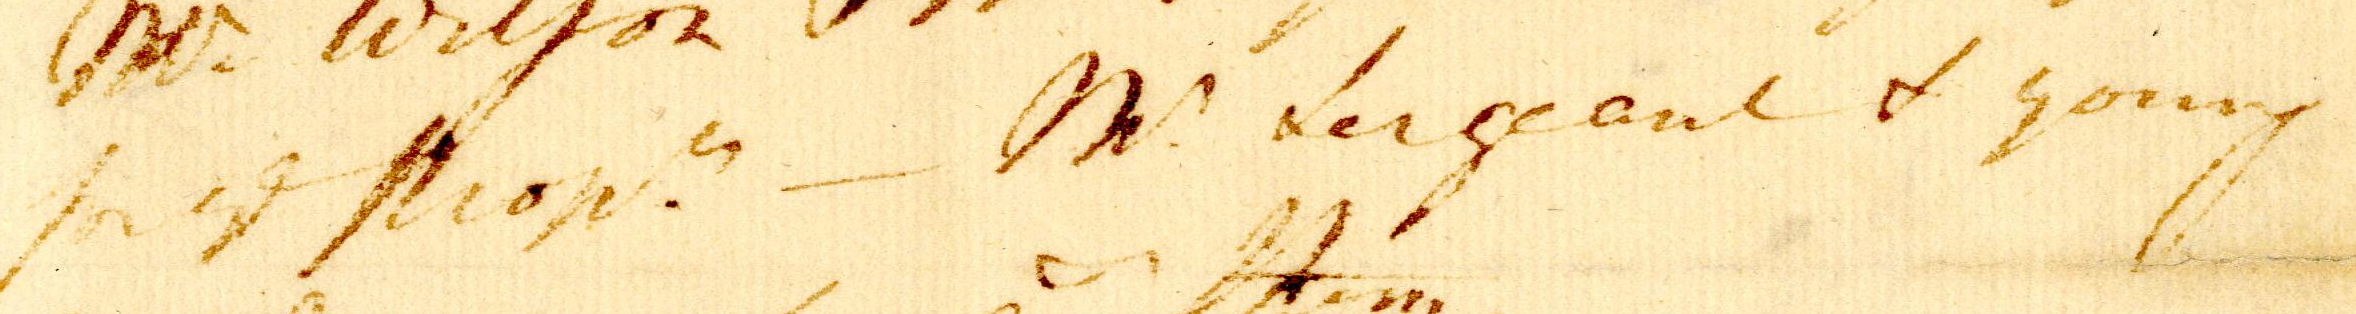for y^e Prop^ty. M^r. Sergeant & young
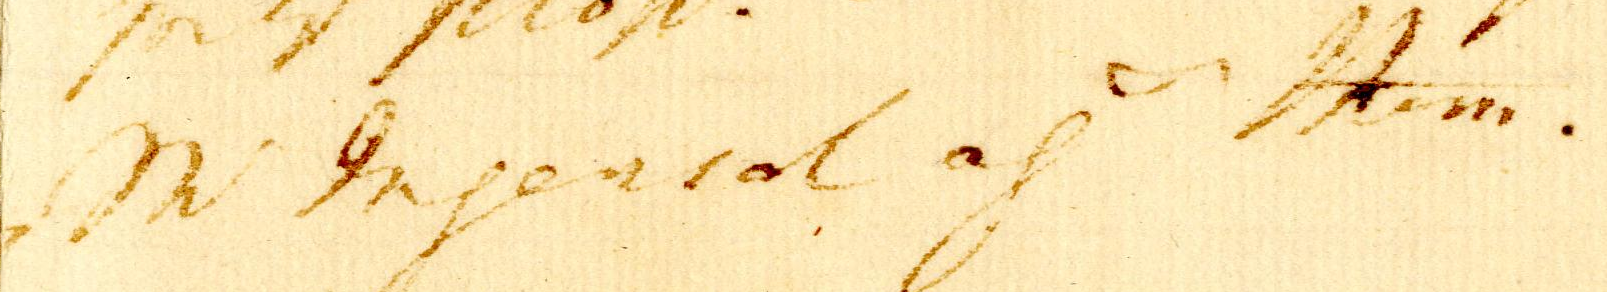M Ingersol of Storm
